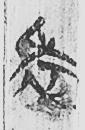卒B
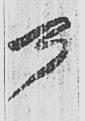乃
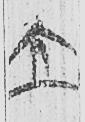立
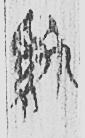{奚人九}
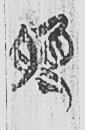{次肉}
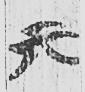亓
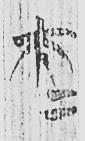夫=
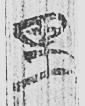里
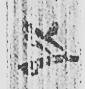之
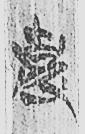尅
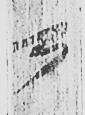乃
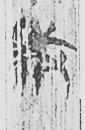殺
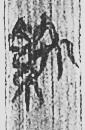{奚人九}
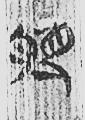{次肉}
